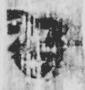叴（皋）
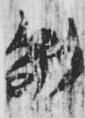咎（陶）
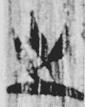之
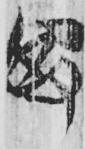臤（賢）
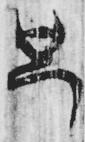也
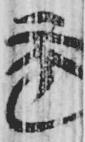而
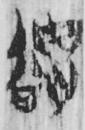欲
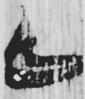㠯（以）
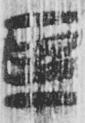爲
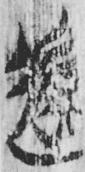後
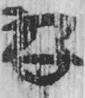叴（皋）
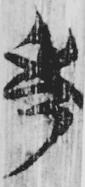秀（陶）
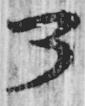乃
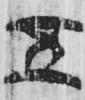五
